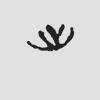出
